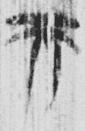天
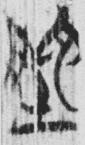○（地）
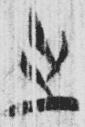之
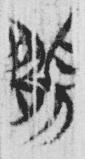○（間）
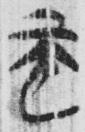而
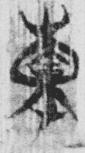○（包）
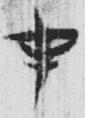才（在）
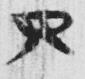四
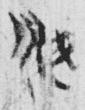○（海）
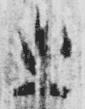之
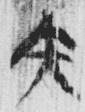內
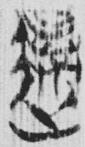○（畢）
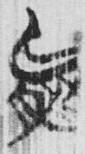能
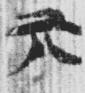亓（其）
